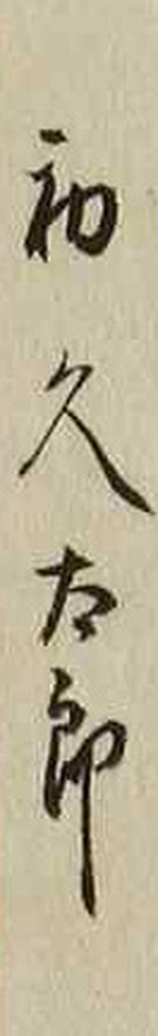初久太郎
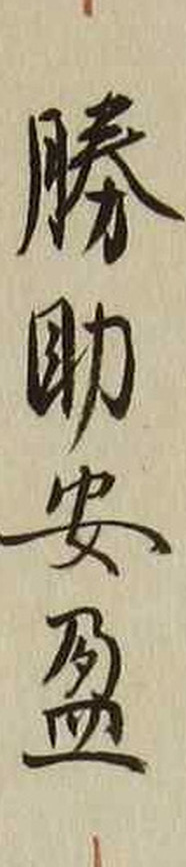勝助安盈
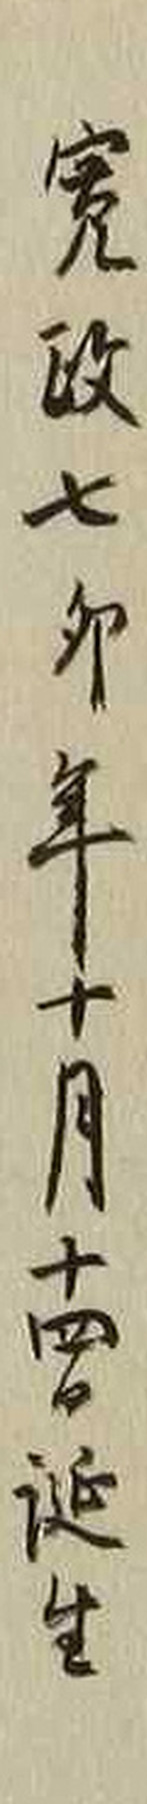寛政七卯年十月十四日誕生
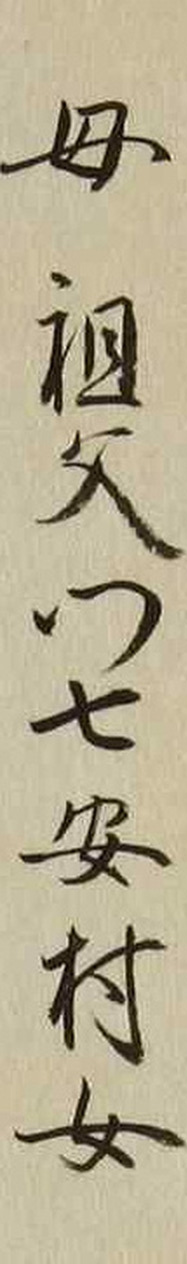母祖父門七安村女
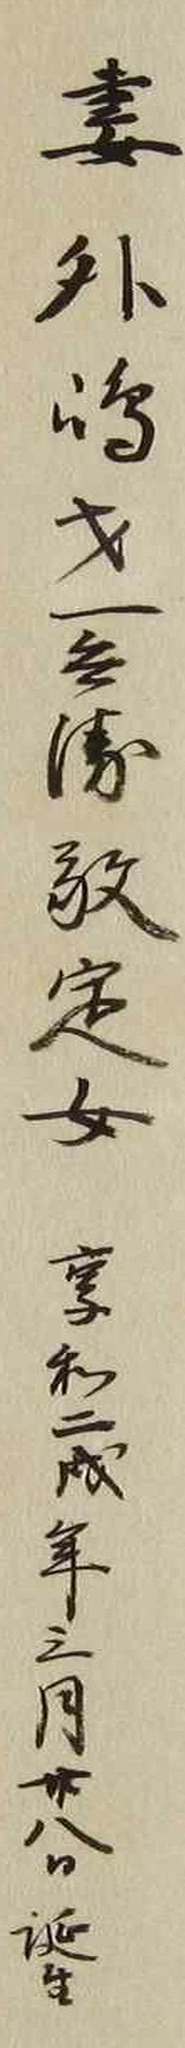妻外嶋才一兵衛敬定女享和二戌年三月廿八日誕生
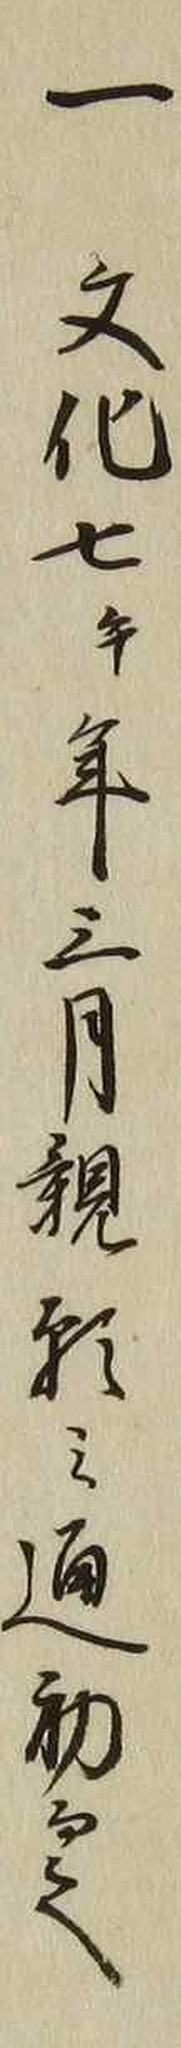一文化七午年三月親願い之通初めて之
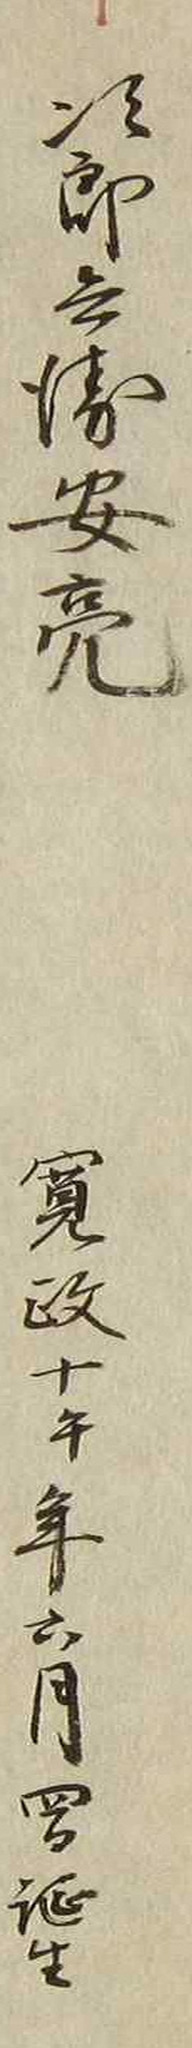次郎兵衛安亮寛政十午年六月四日誕生
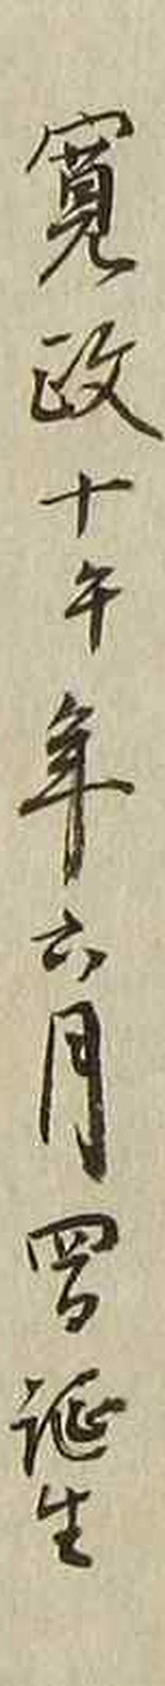寛政七卯年十月十四日誕生
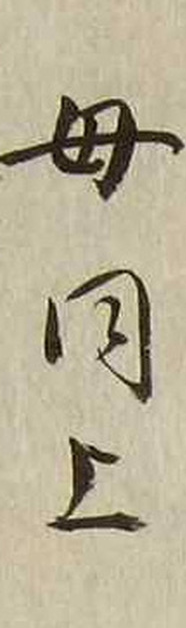母同上
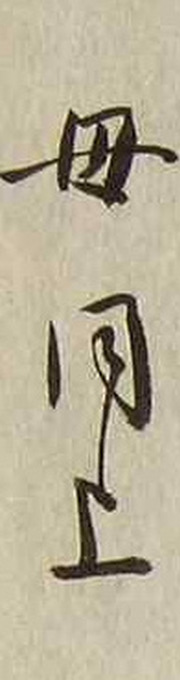母同上

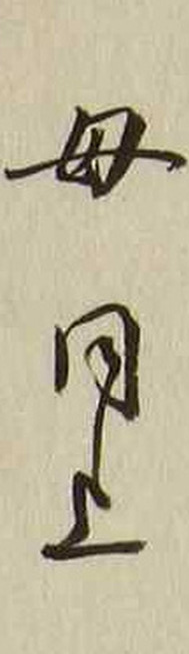母同上
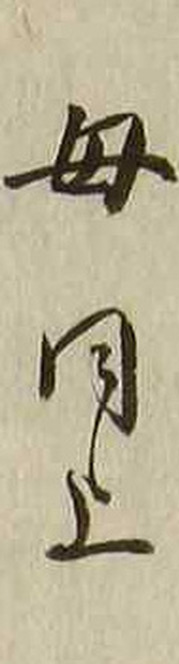母同上
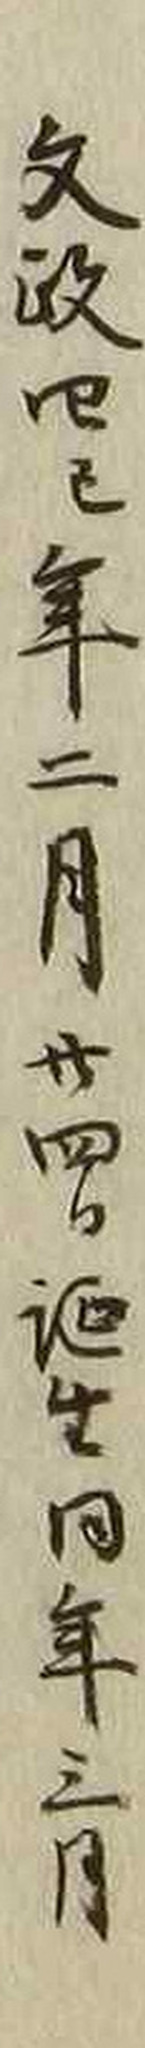文政四巳年二月廿四日誕生同年三月
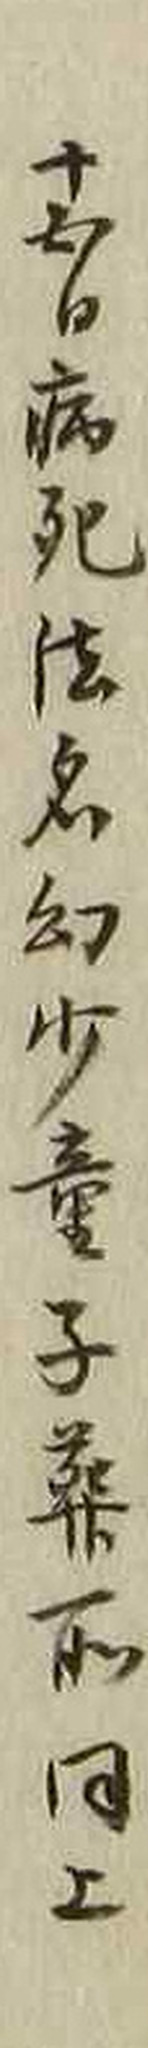某十五日病死法名幼少童子葬所同上
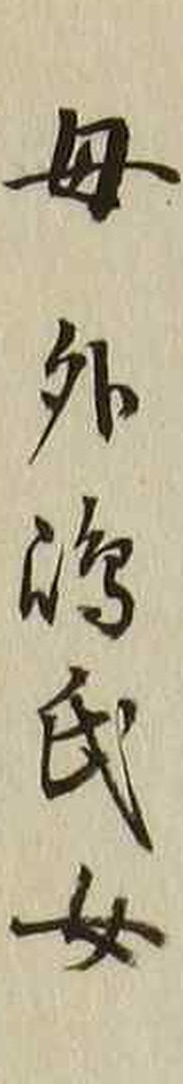母外嶋氏女
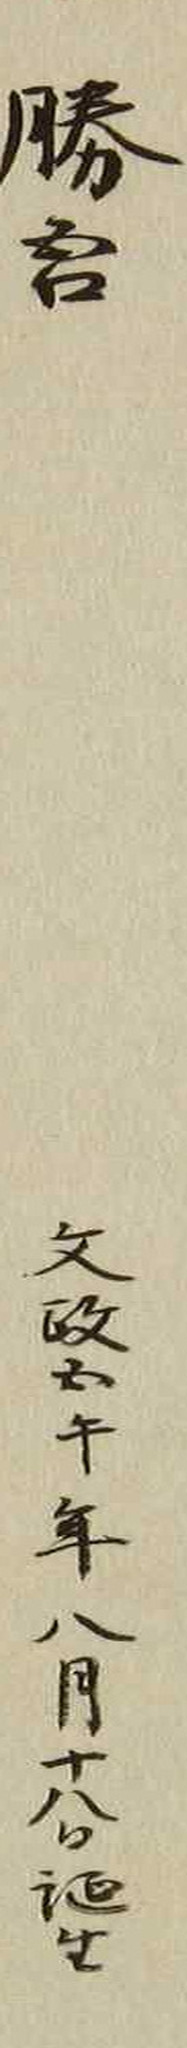勝吾文政五午年八月十八日誕生
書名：諸士系譜　巻之19　い之部19
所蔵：会津若松市立会津図書館
